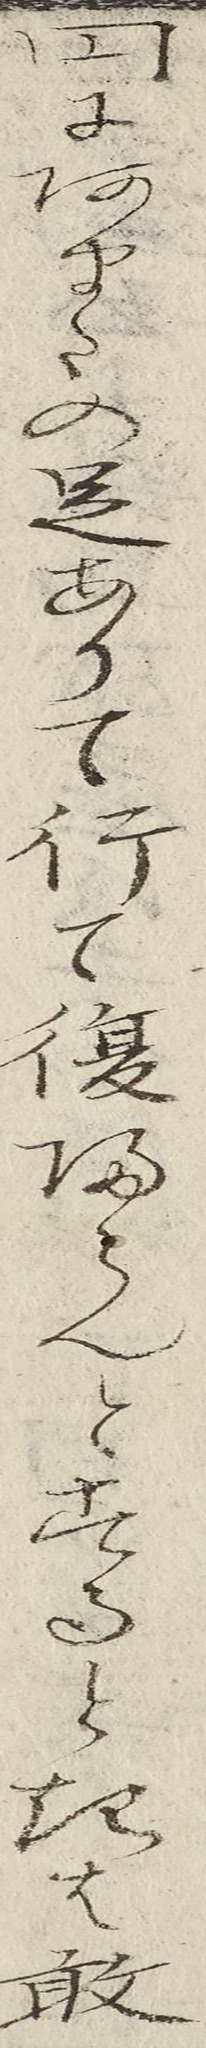円にあまたの足ありて行て復帰らんとするときは敢
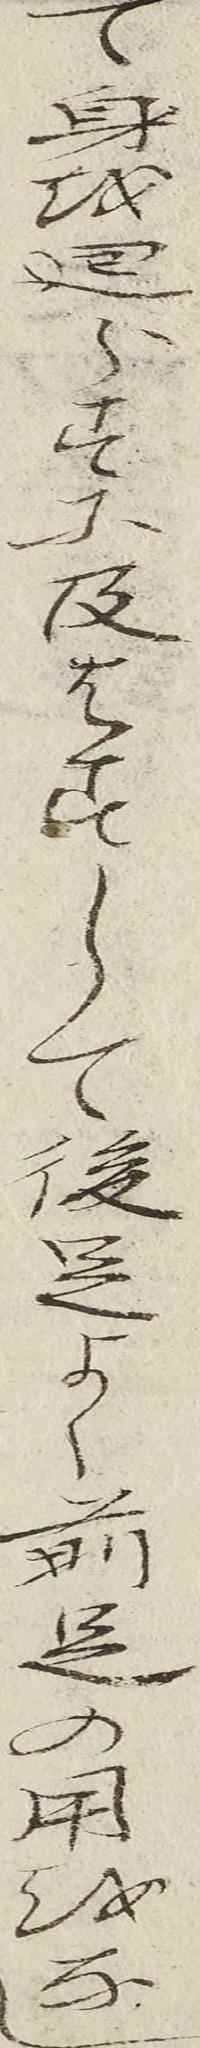て身を廻らすに及はすして後足よく前足の用をなし
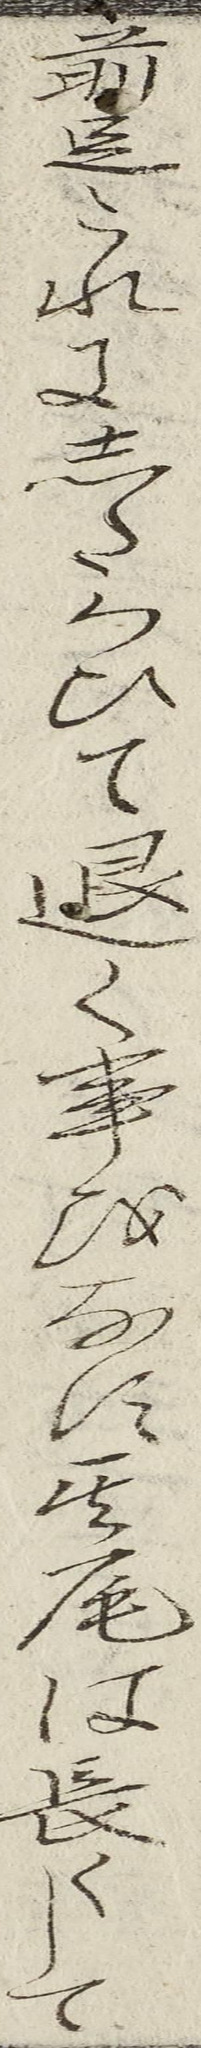前足これにしたかひて退く事をなす其尾は長くして
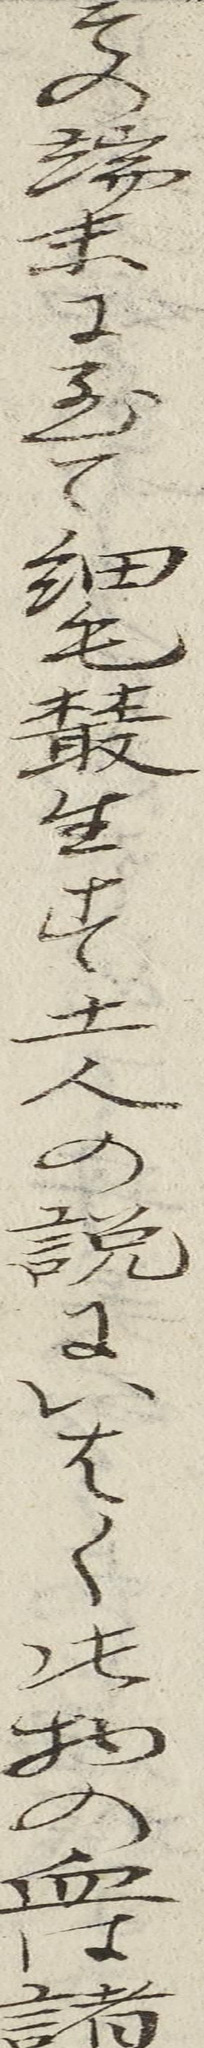その端末に至て細毛叢生す土人の説にいはく此物の血は諸
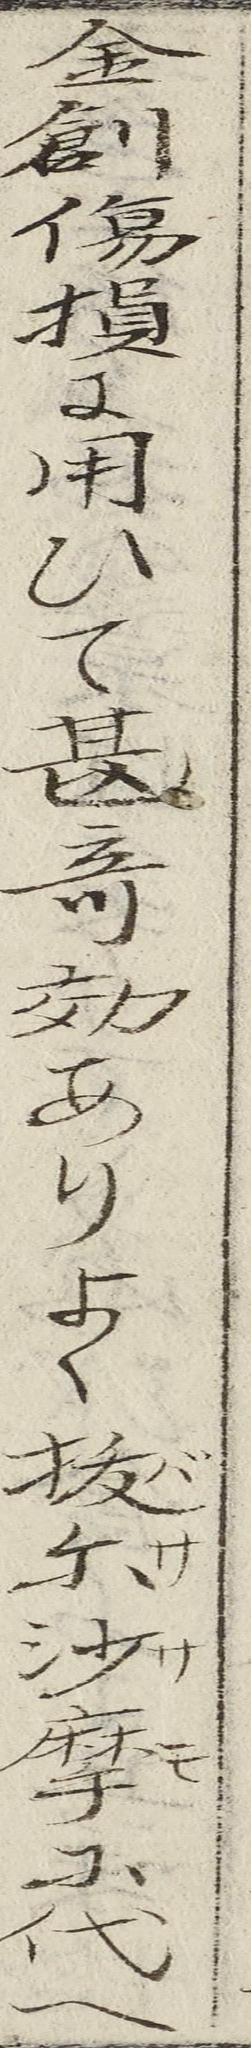金創傷損に用ひて甚奇効ありよく拔尓沙摩に代へ
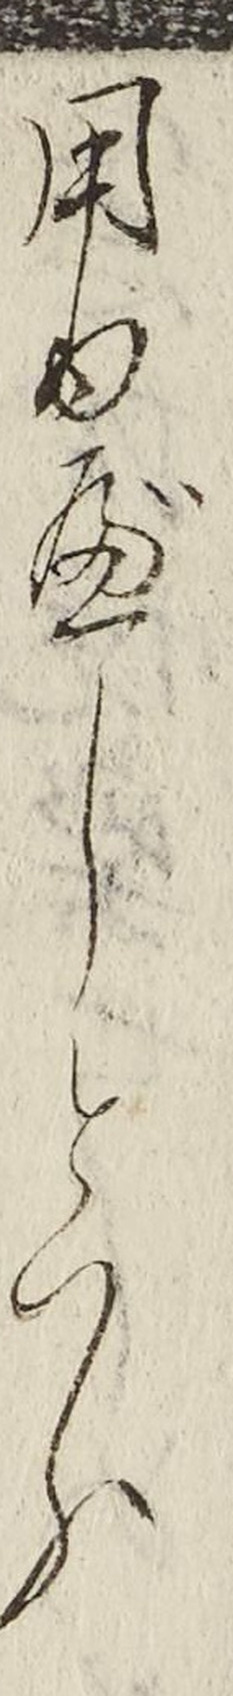用ゆべしといふ
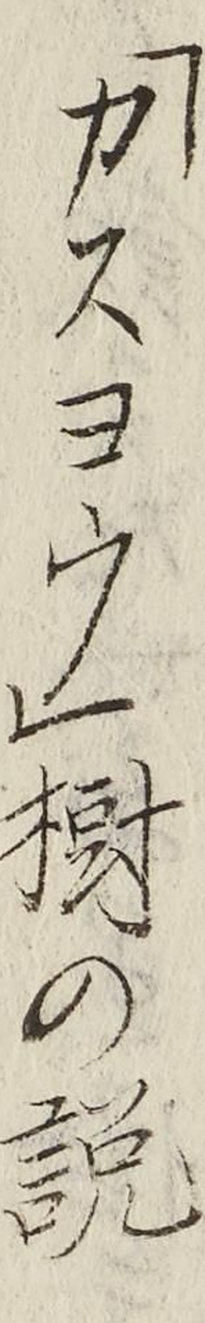「カスヨウ」樹の説
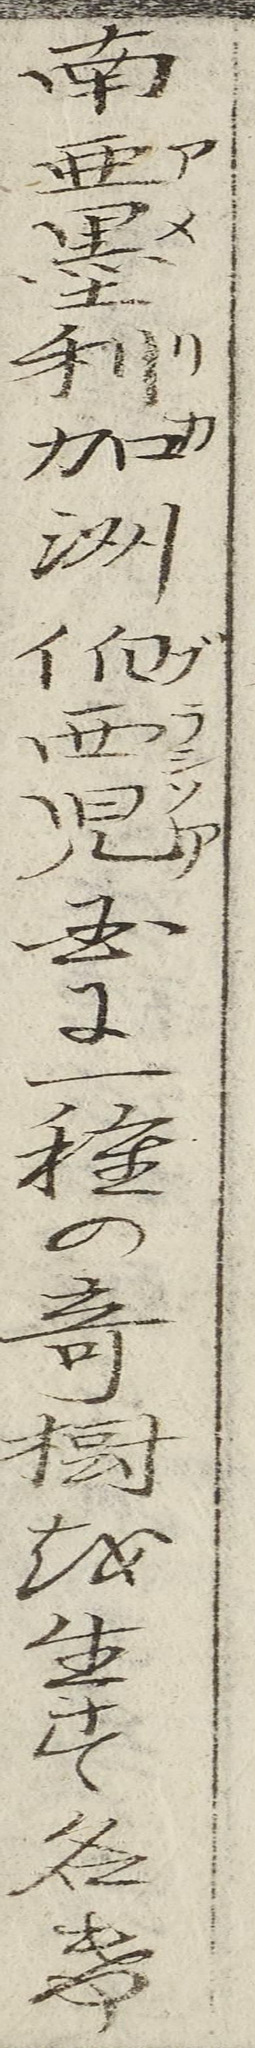南亜墨利加洲伯西児国に一種の奇樹を生す名け
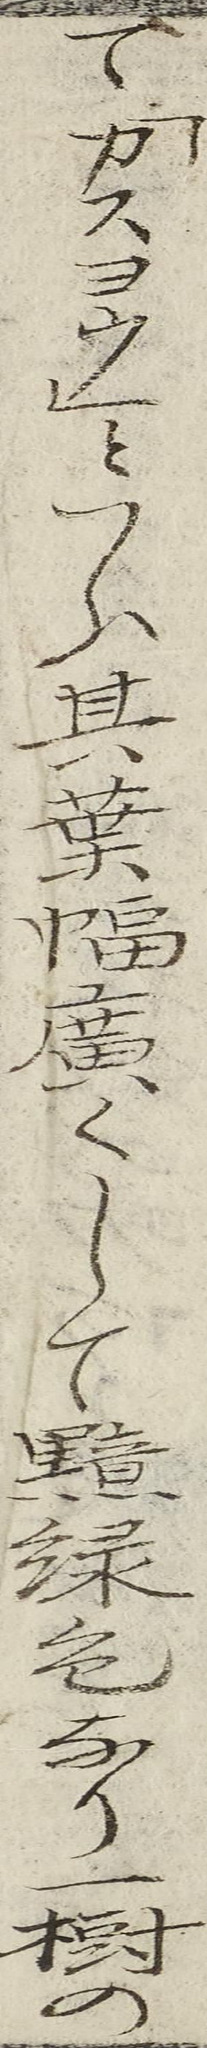て「カスヨウ」といふ其葉幅広くして黯緑色なり一樹の
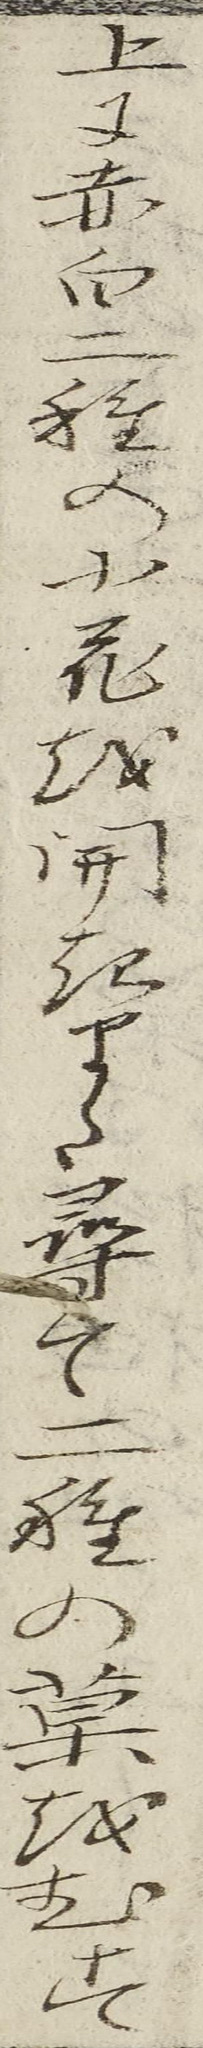上に赤白二種の小花を開きまた尋て二種の菓をむす

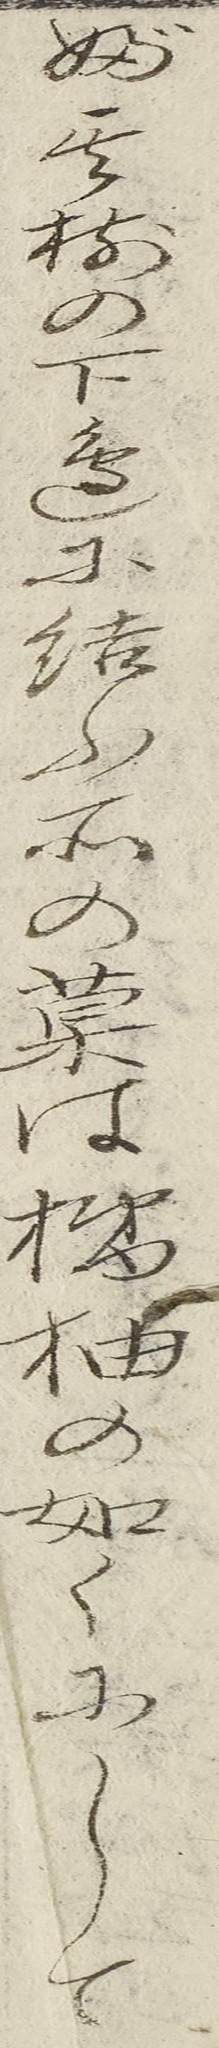ぶ其樹の下辺に結ふ所の菓は橘柚の如くにして
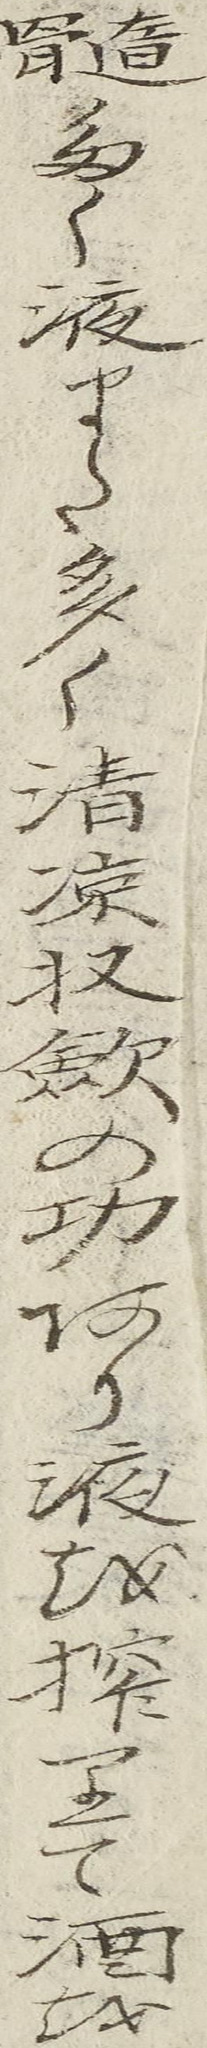髄多く液また多く清涼収歛の効あり液を搾りて酒を
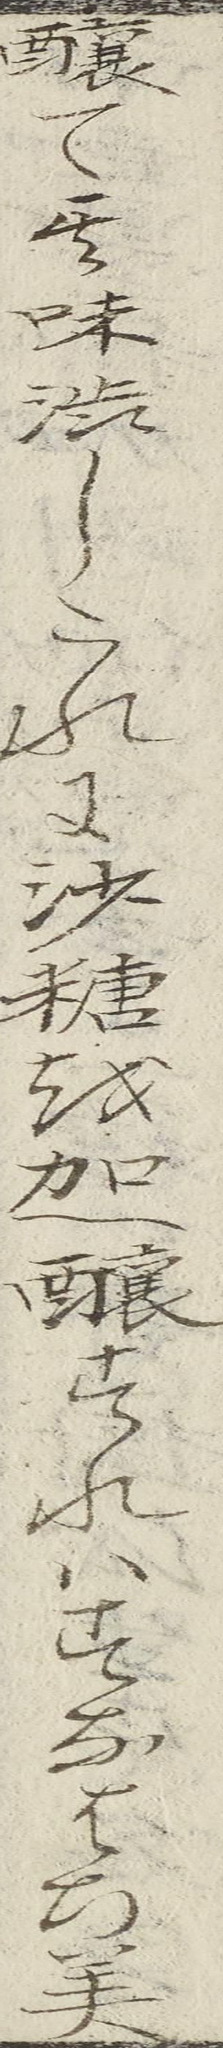醸て其味渋しこれに沙糖を加へ醸すれはすなはち美
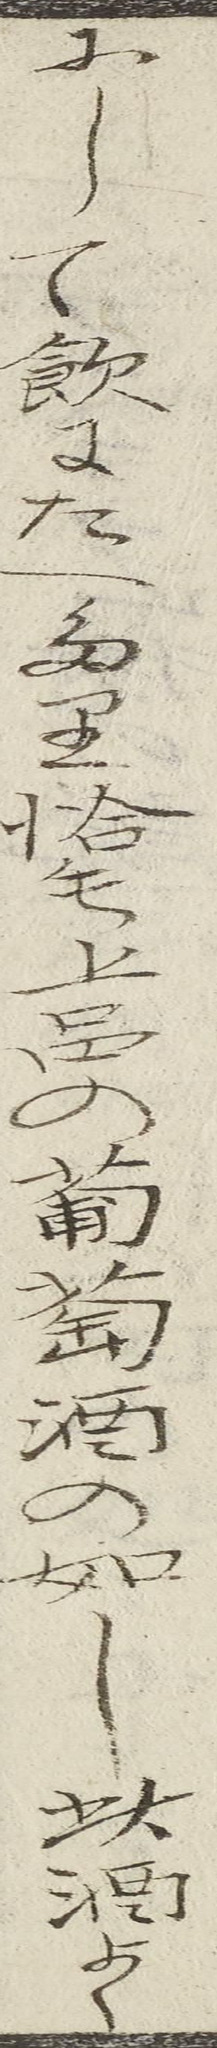にして飲にたへたり恰も上品の葡萄酒の如し此酒よく
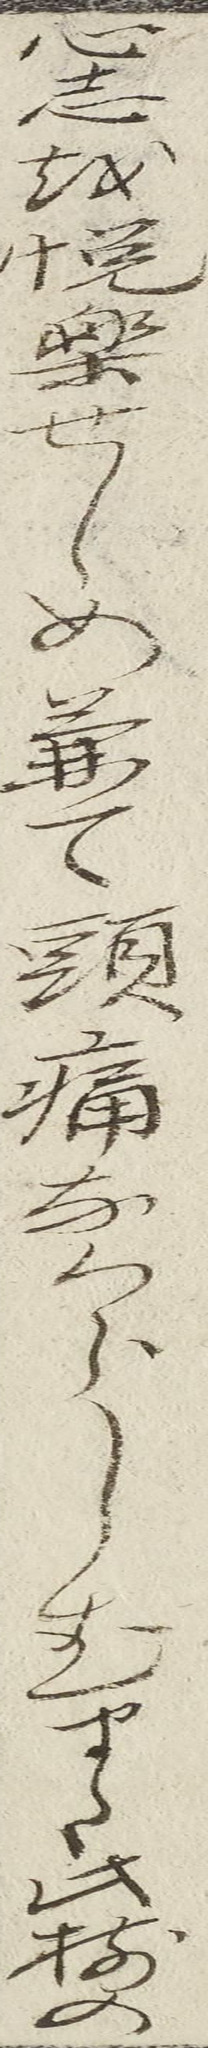心志を悦楽せしめ兼て頭痛なからしむまた此樹の
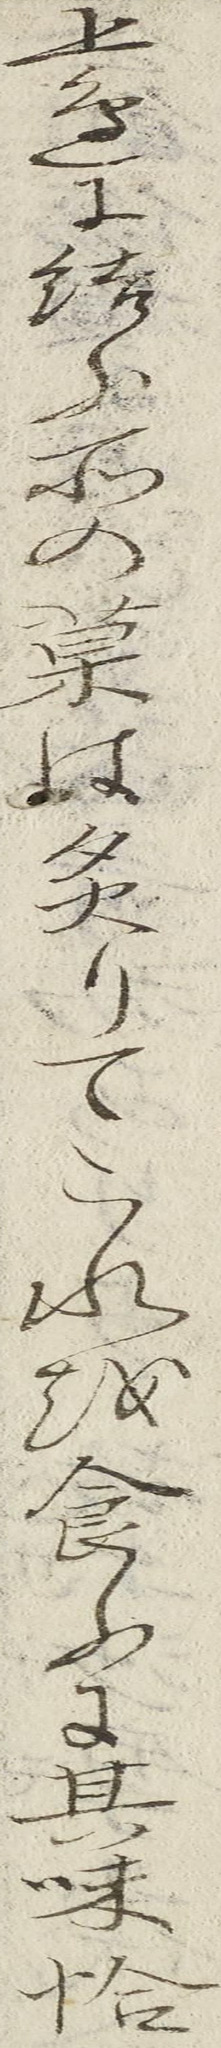上辺に結ふ所の菓は炙りてこれを食ふに其味恰
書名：西洋雜記　乾
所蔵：東京大学地震研究所図書室 Earthquake Research Institute Library, The University of Tokyo, JAPAN
